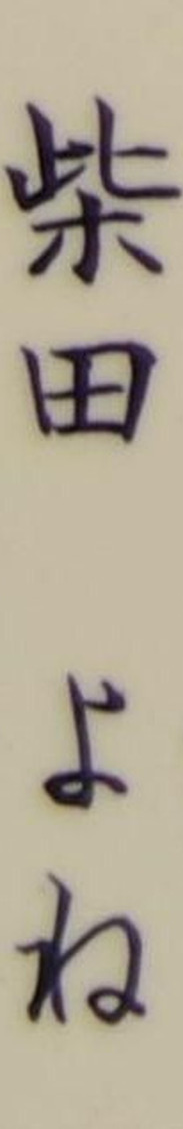柴田よね
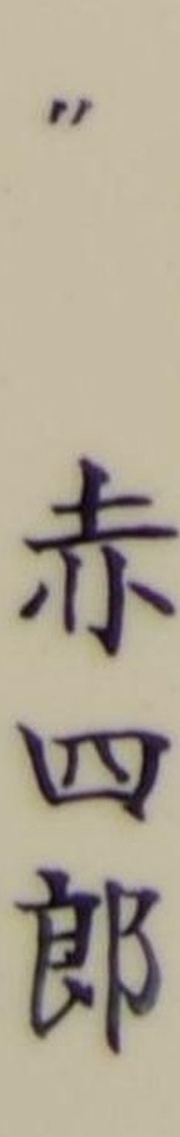赤四郎
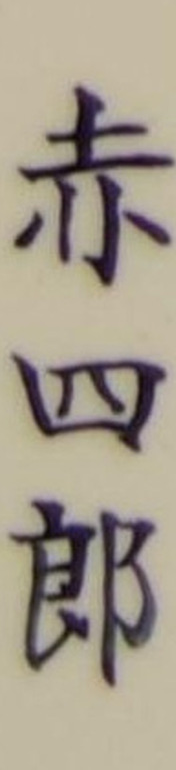赤四郎
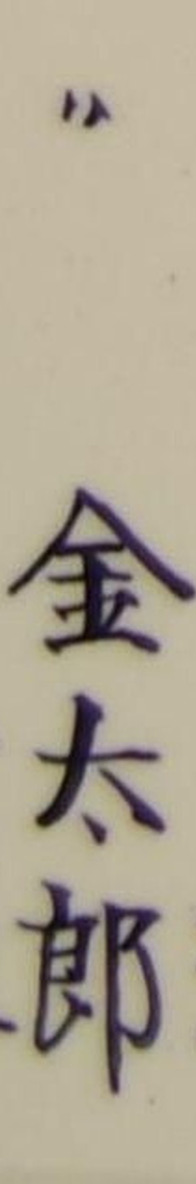金太郎
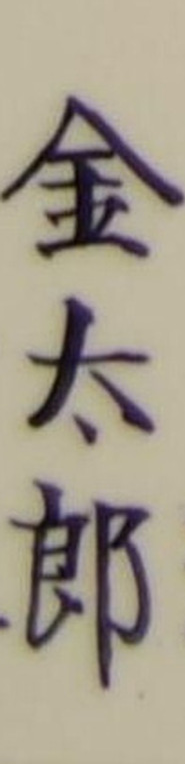金太郎

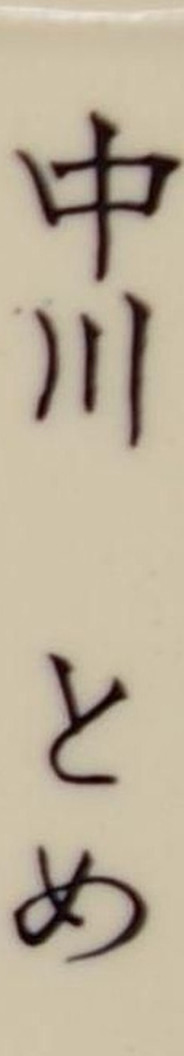中川とめ
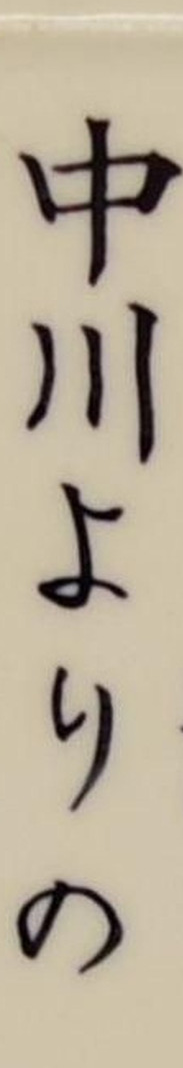中川よりの
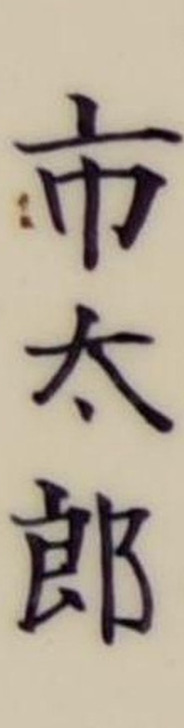市太郎
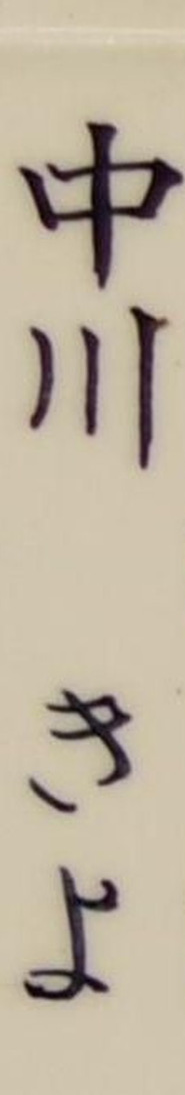中川きよ
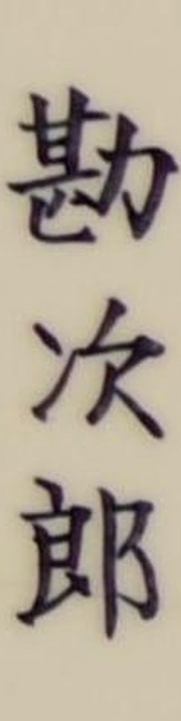勘次郎
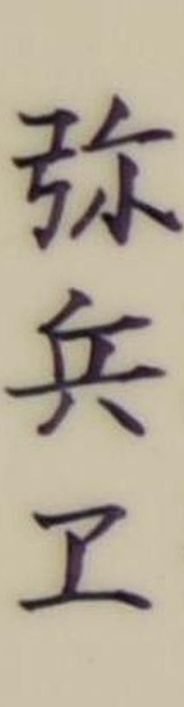弥兵衛

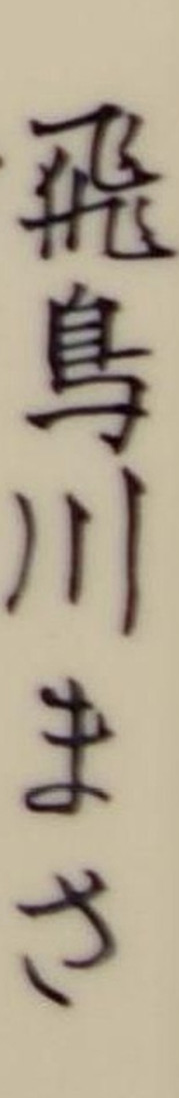飛鳥川まさ
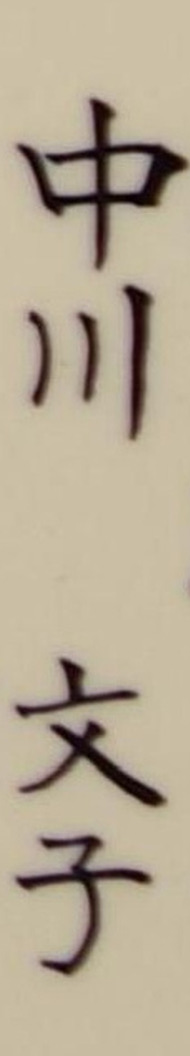中川文子
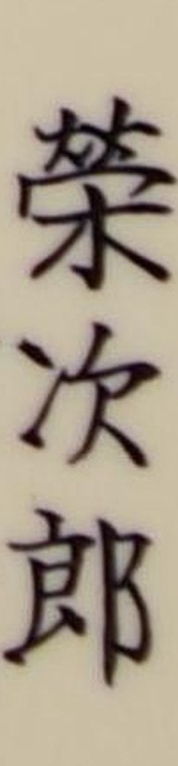榮次郎
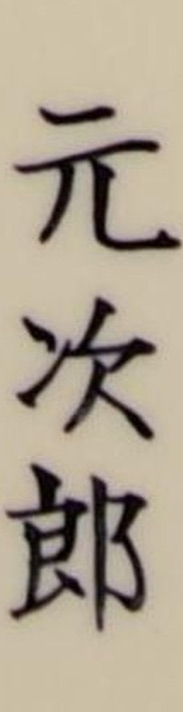元次郎
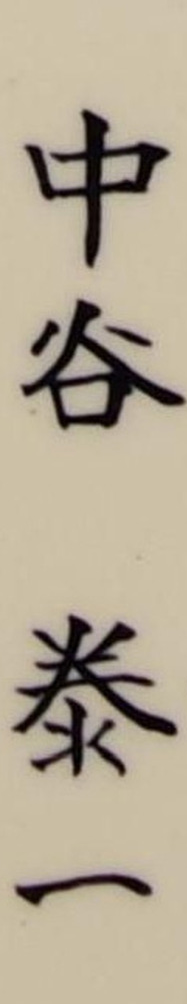中谷泰一
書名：A~D
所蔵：koyasan kongobuji
